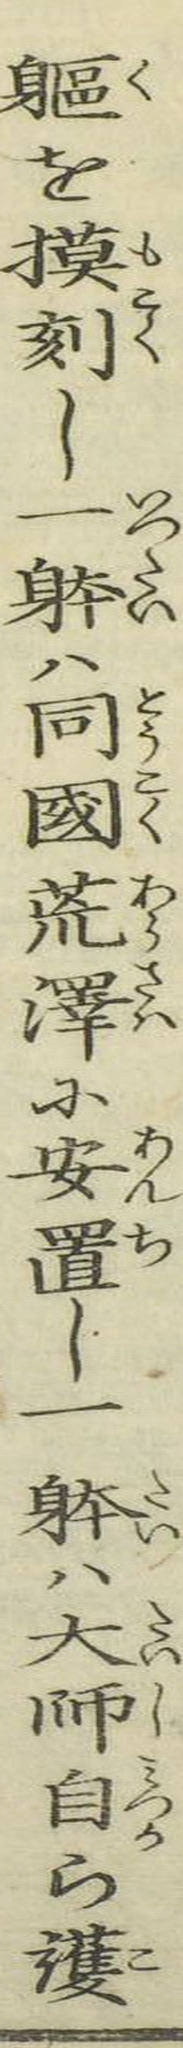軀を摸刻し一躰は同國荒澤に安置し一躰は大師自ら護
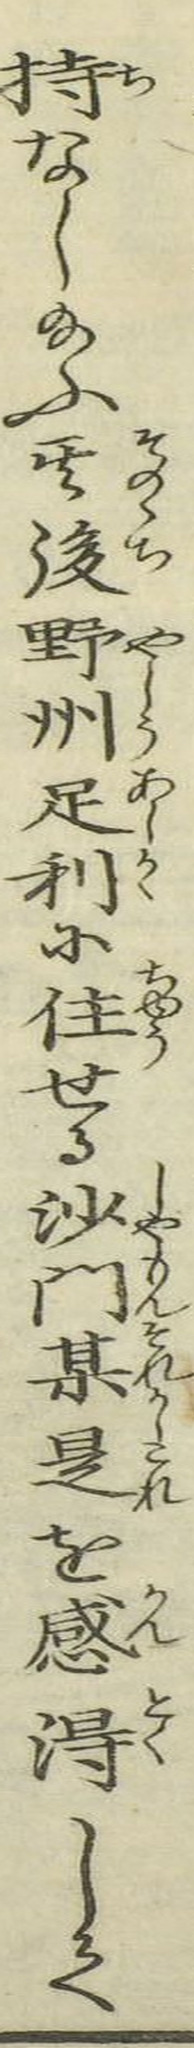持なし給ふ其後野州足利に住せる沙門某是を感得して
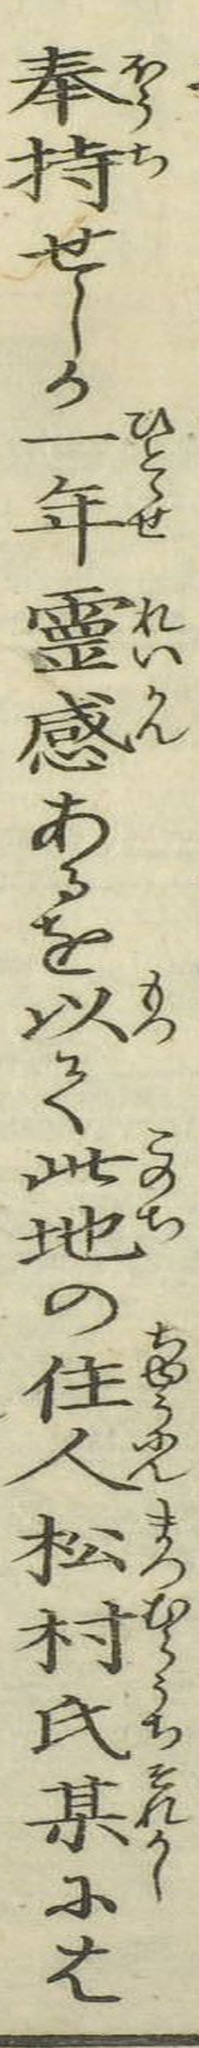奉持せしか一年霊感あるを以て此地の住人松村氏某には
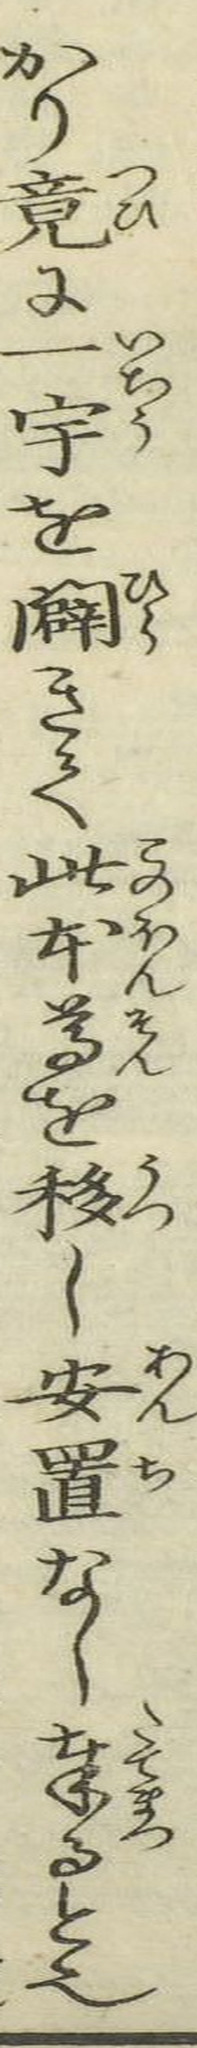かり竟に一宇を闢きて此本尊を移し安置なし奉ると也
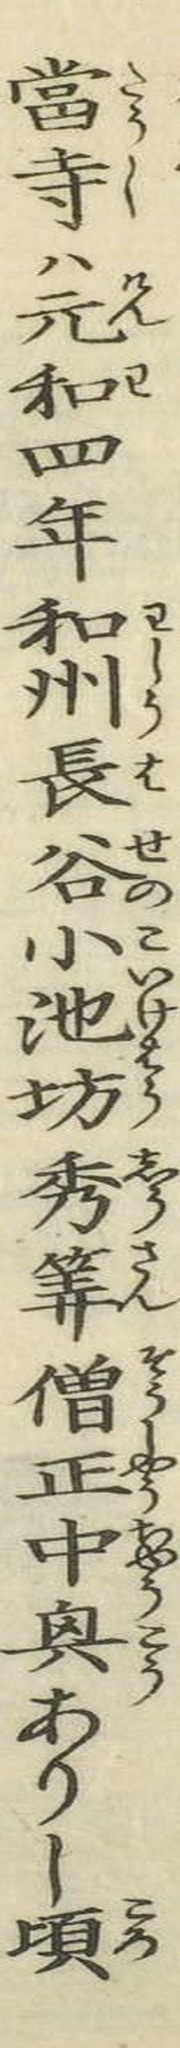當寺は元和四年和州長谷小池坊秀筭僧正中興ありし頃
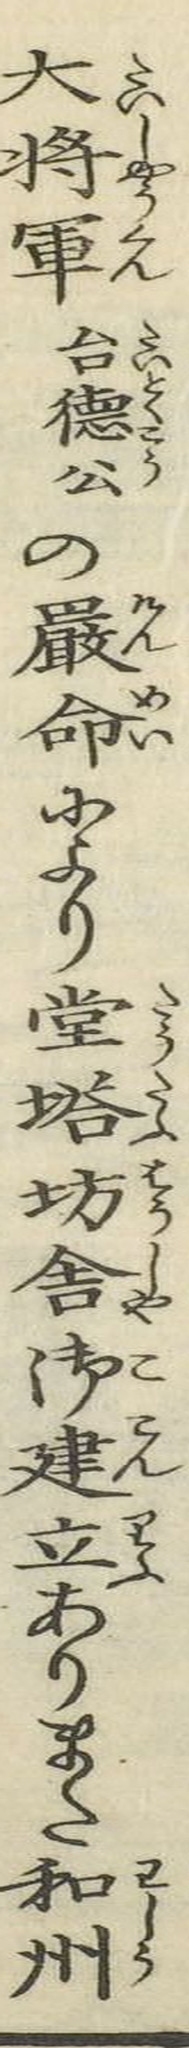大将軍台德公の嚴命により堂塔坊舎御建立ありまた和州
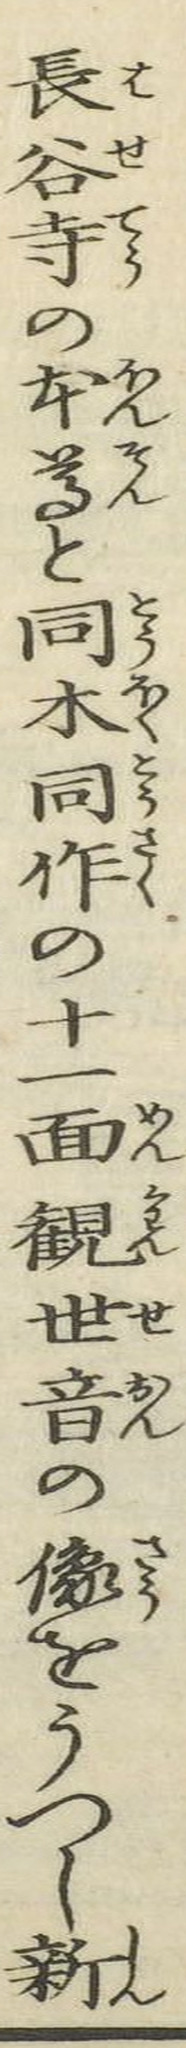長谷寺の本尊と同木同作の十一面観世音の像をうつし新
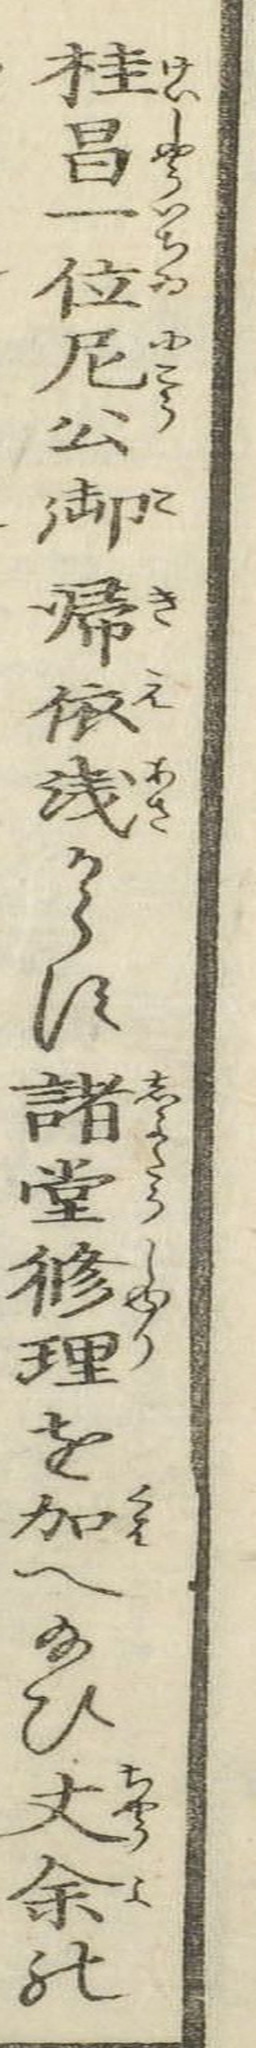桂昌一位尼公御帰依浅からす諸堂修理を加へ給ひ丈余の
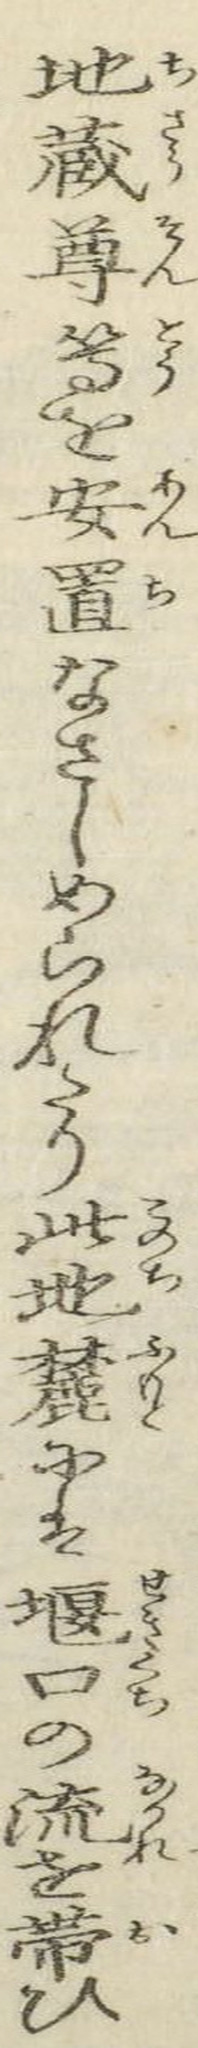地蔵尊等を安置なさしめられたり此地麓には堰口の流を帯ひ
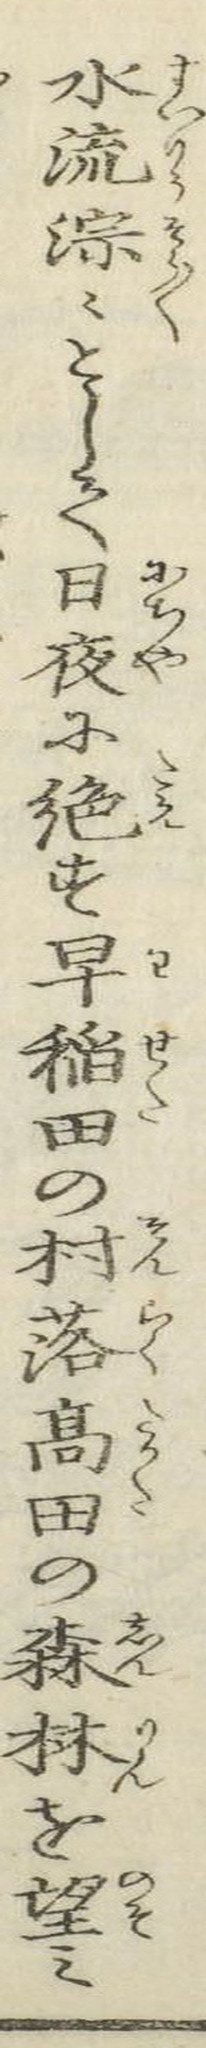水流淙々として日夜に絶す早稲田の村落髙田の森林を望み
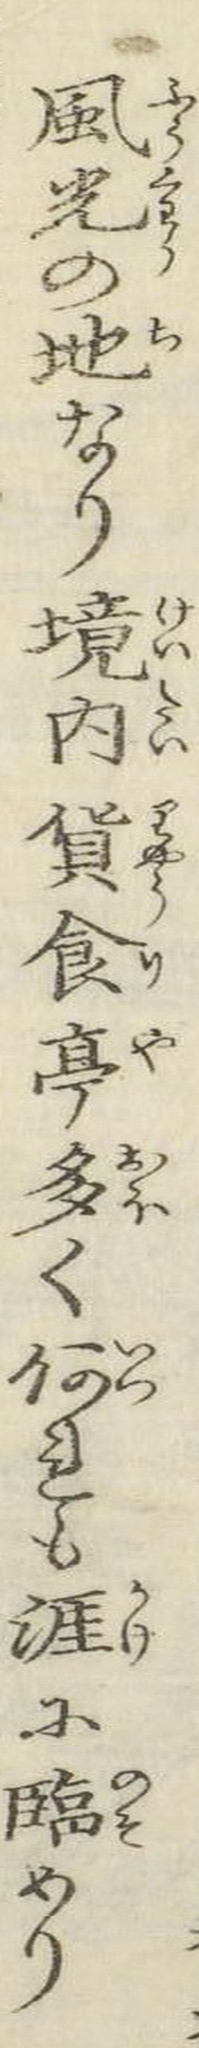風光の地なり境内貨食亭多く何れも涯に臨めり
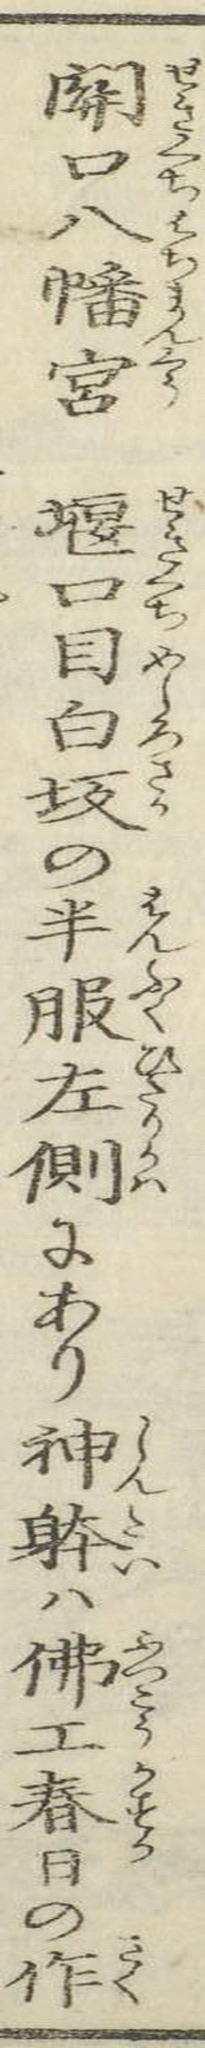關口八幡宮堰口目白坂の半服左側にあり神躰は佛工春日の作
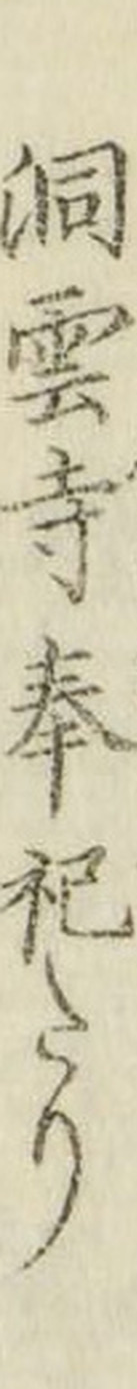洞雲寺奉祀たり
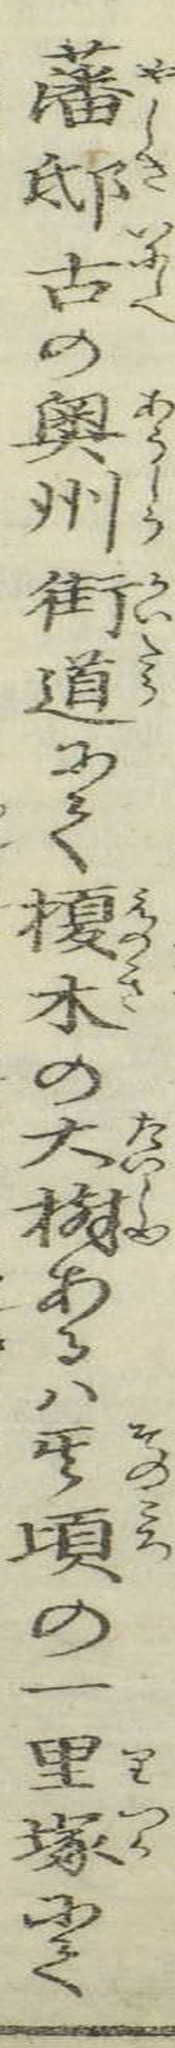藩邸古の奥州街道にて榎木の大樹あるは其頃の一里塚にて
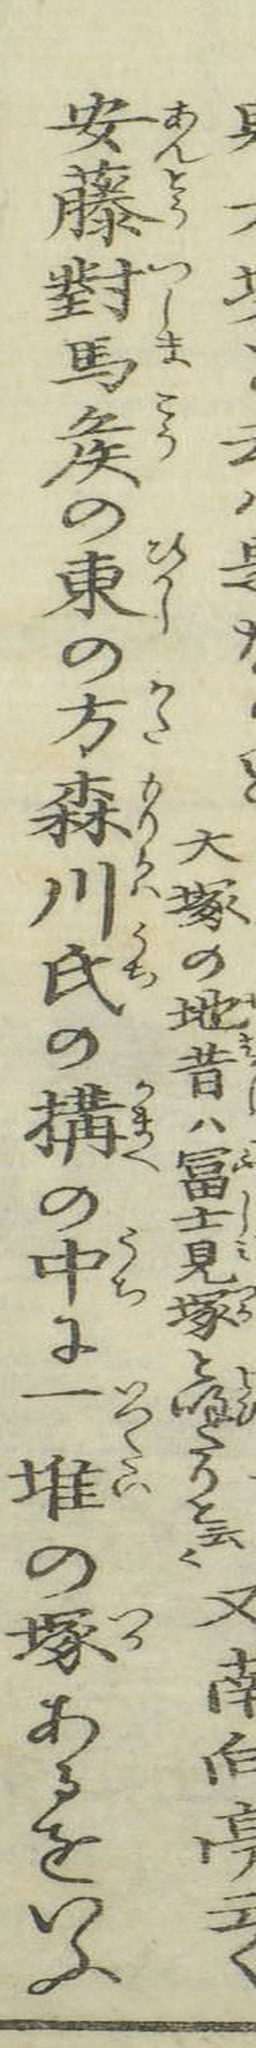安藤對馬侯の東の方森川氏の搆の中に一堆の塚あるをいふ

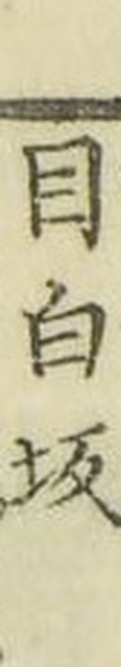目白坂
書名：江戸名所図会 20巻 巻之12
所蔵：東京学芸大学教育コンテンツアーカイブ
